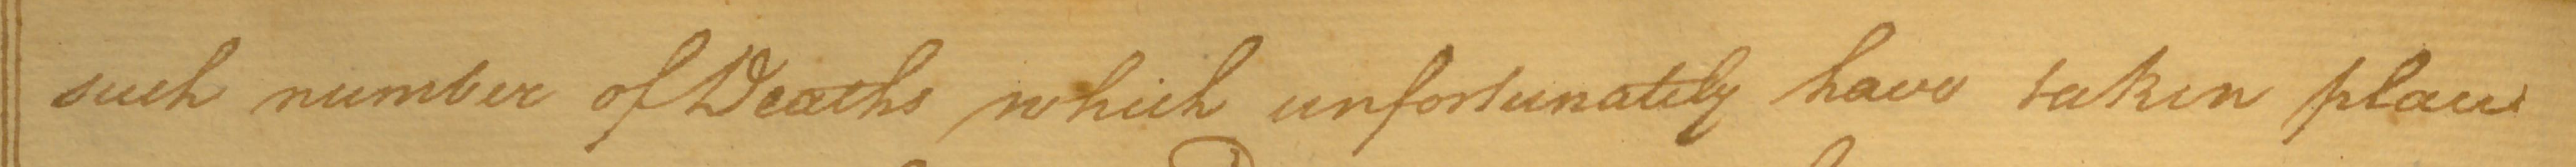such number of Deaths which unfortunately have taken places
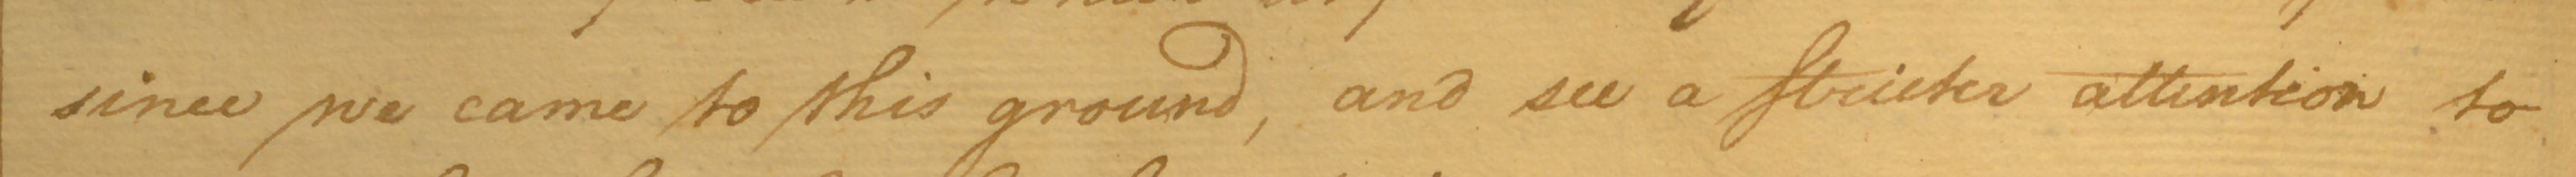since we came to this ground, and see a stricter attention to
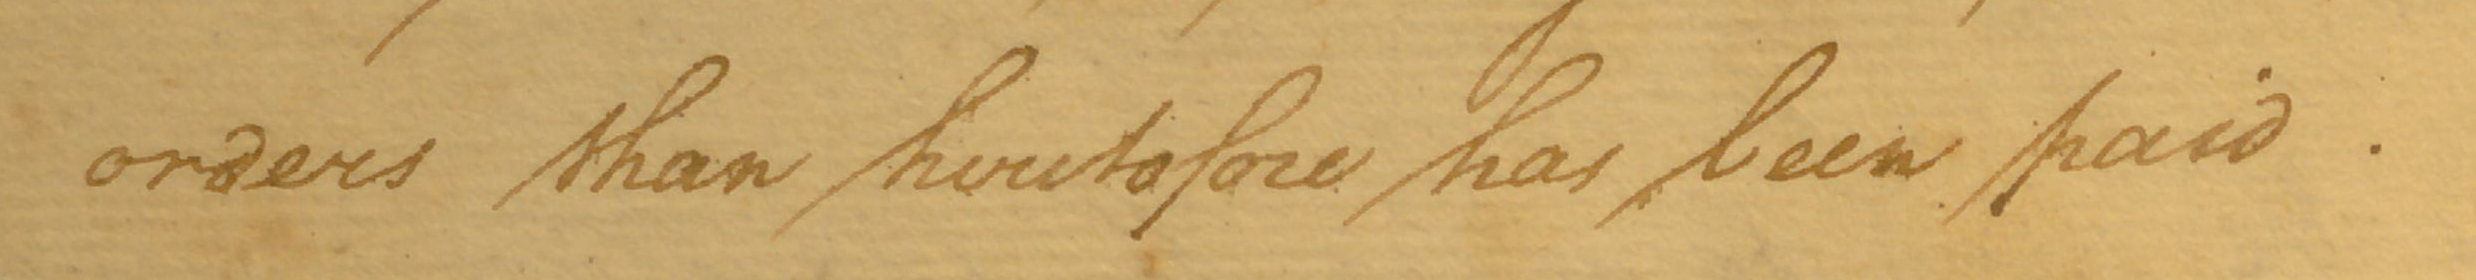orders than heretofore has been paid.
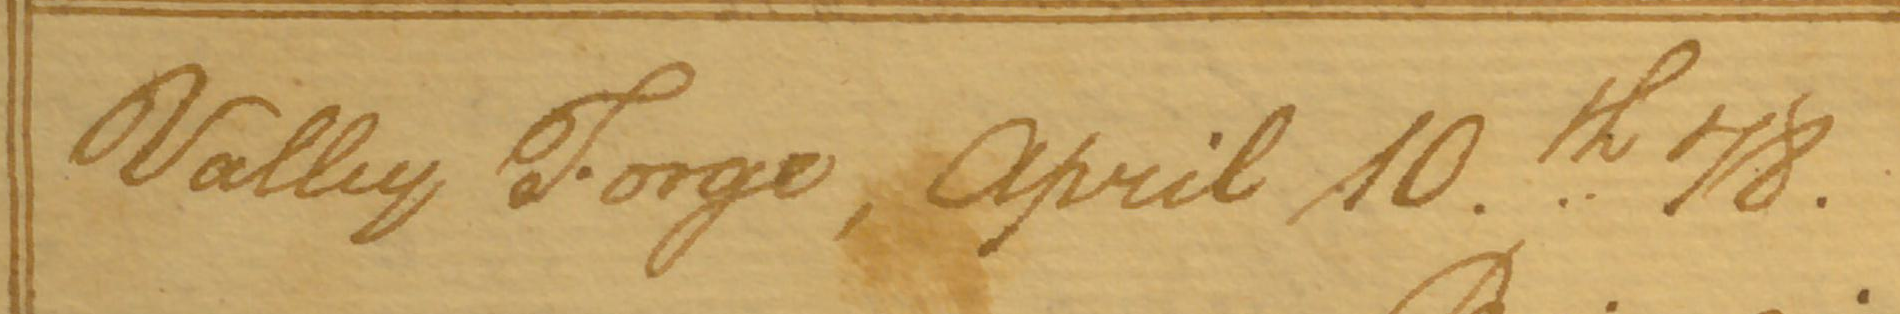Valley Forge, April 10^th. 78.
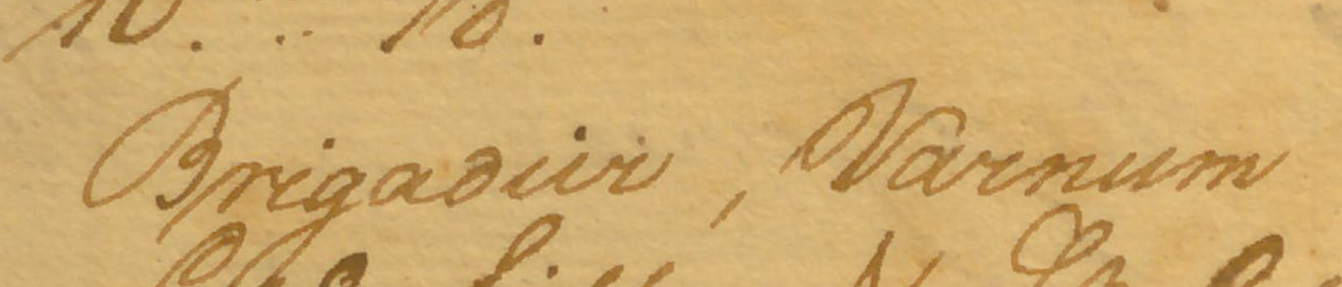Brigadier, Varnum
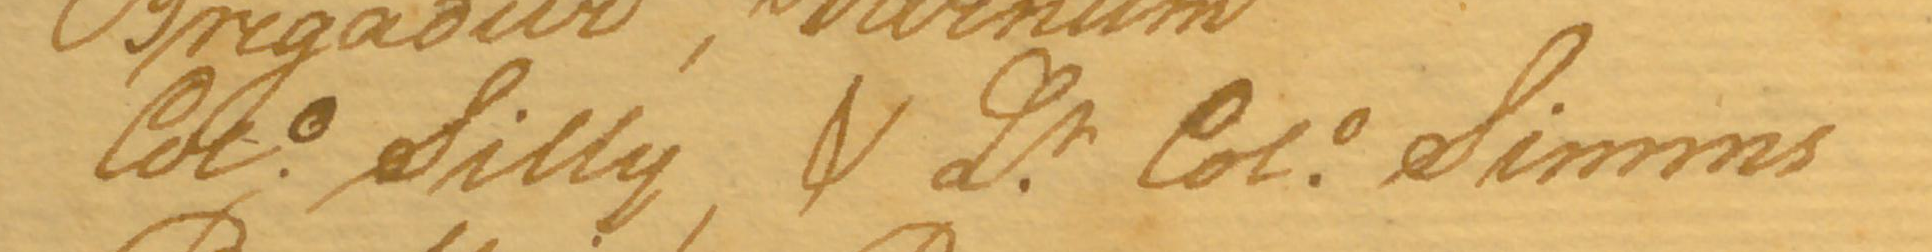Col^o. Silly, & L^t. Col^o. Simms
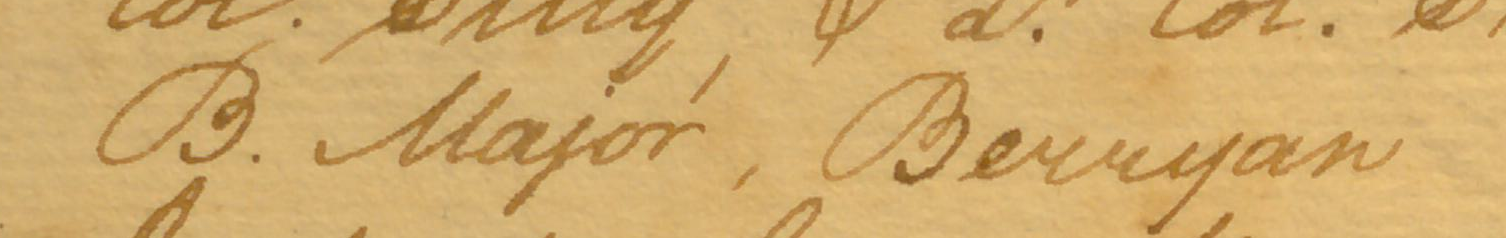B. Major, Berryan
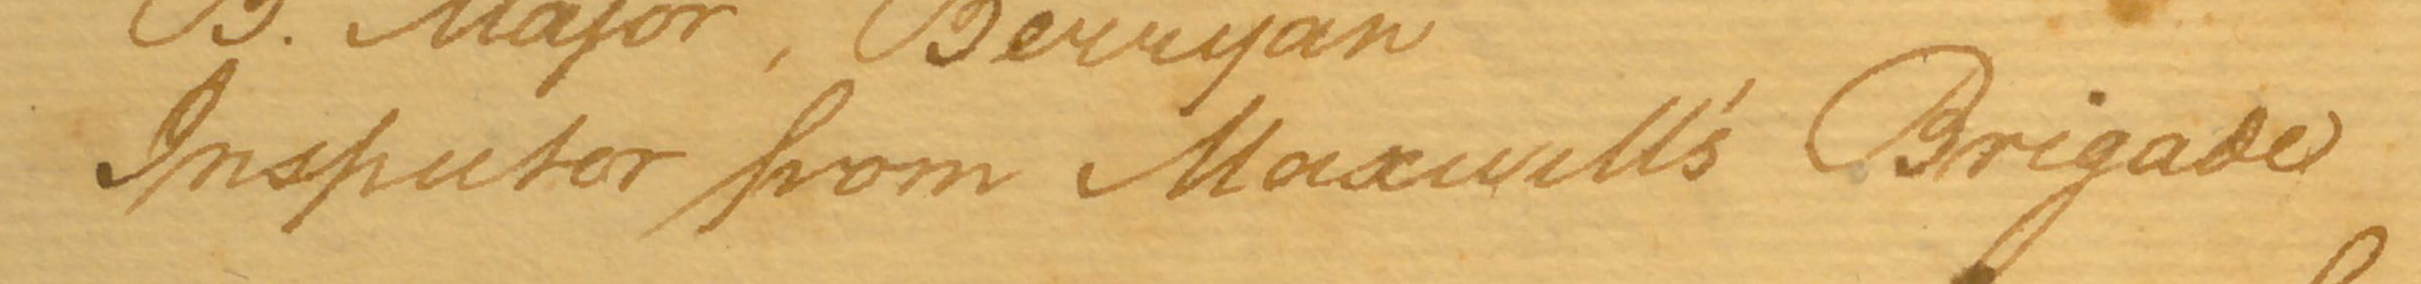Inspector from Maxwell's Brigade
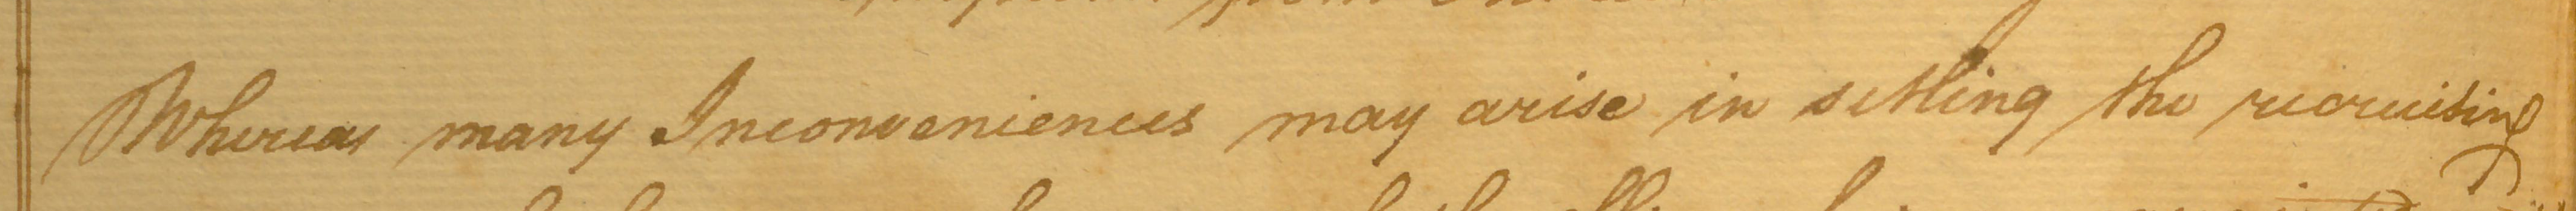Whereas many Inconveniences may arise in setling the recruiting
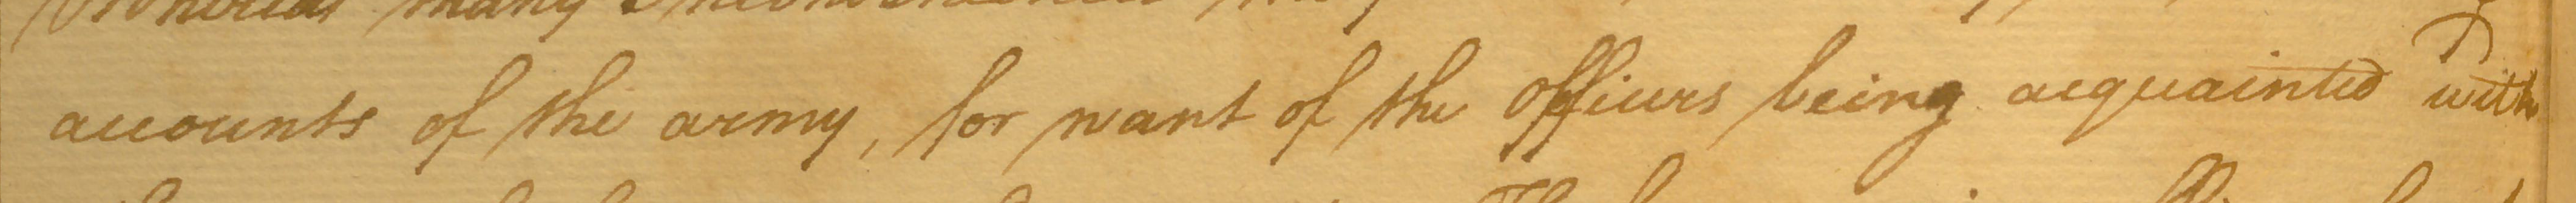accounts of the army, for want of the officers being acquainted with
